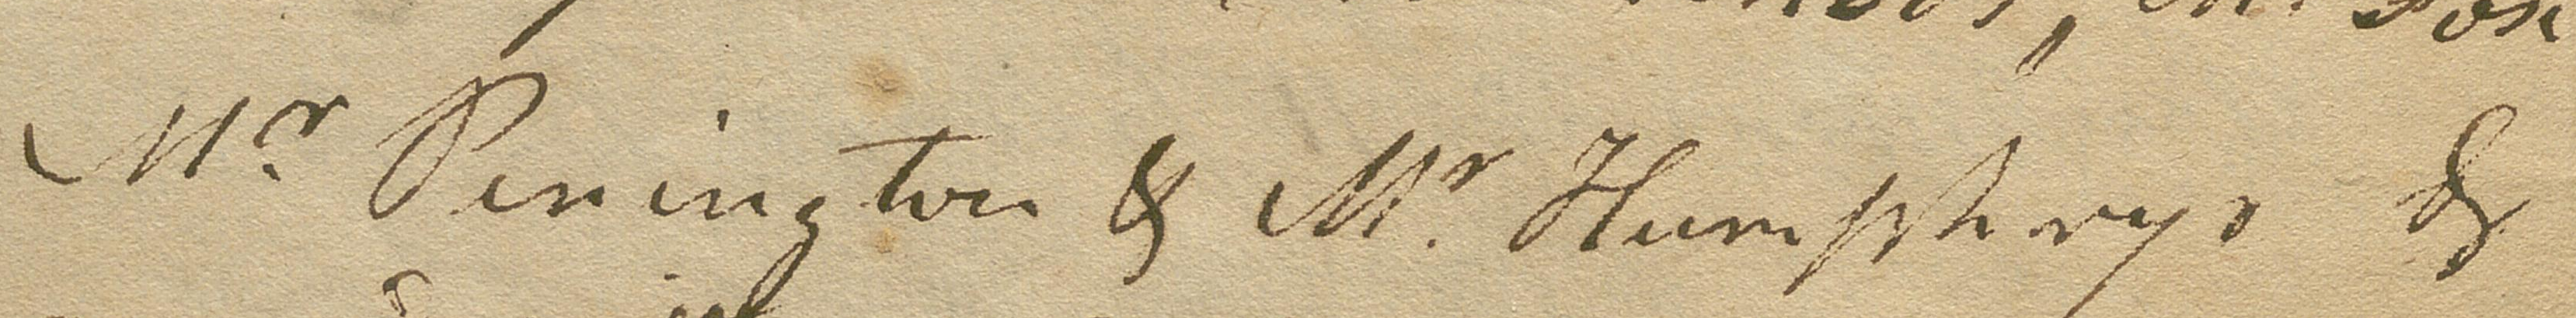M^r. Penington & M^r. Humphrys &
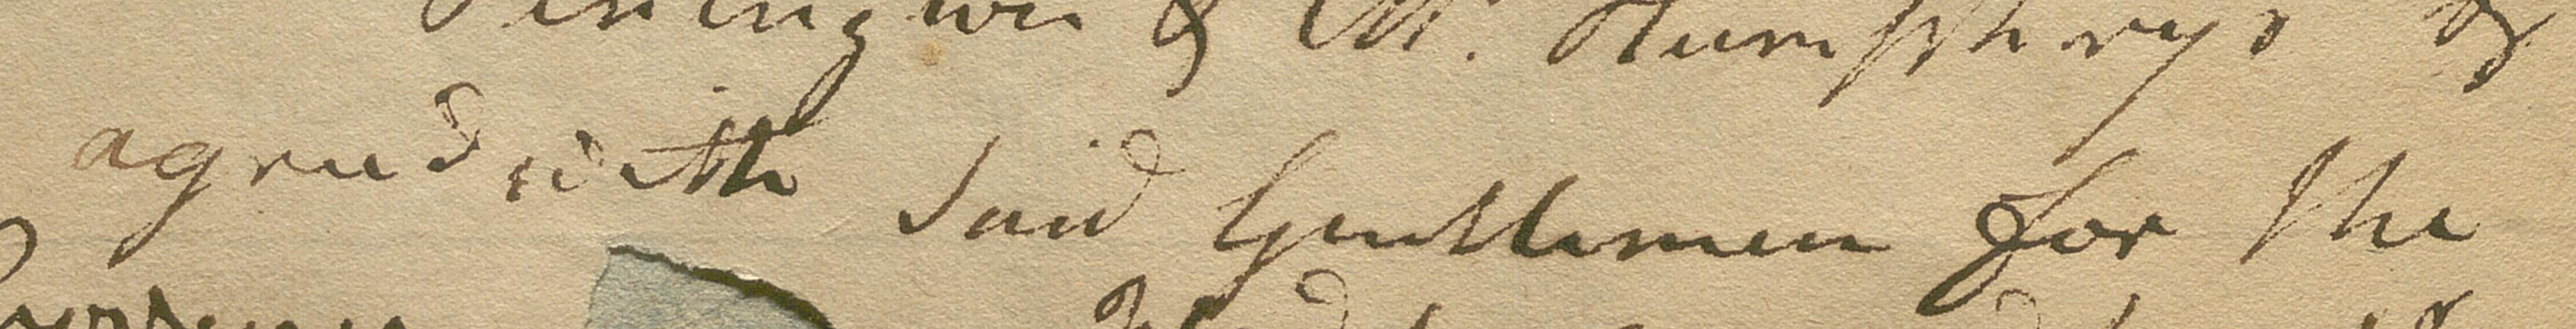agreed with Saw Gentlemen for the
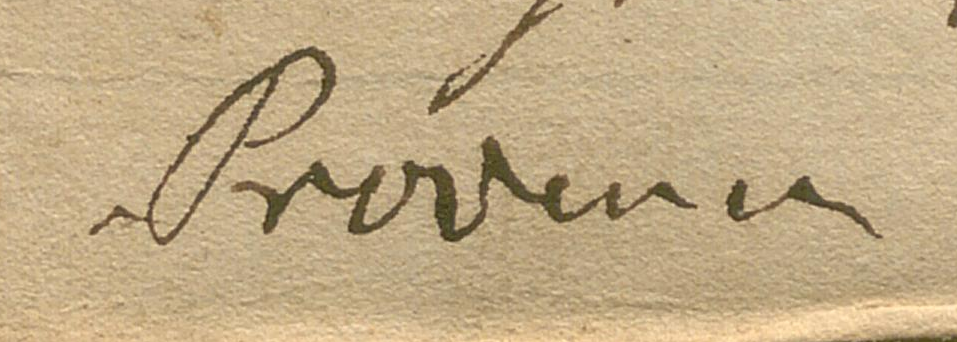Provence
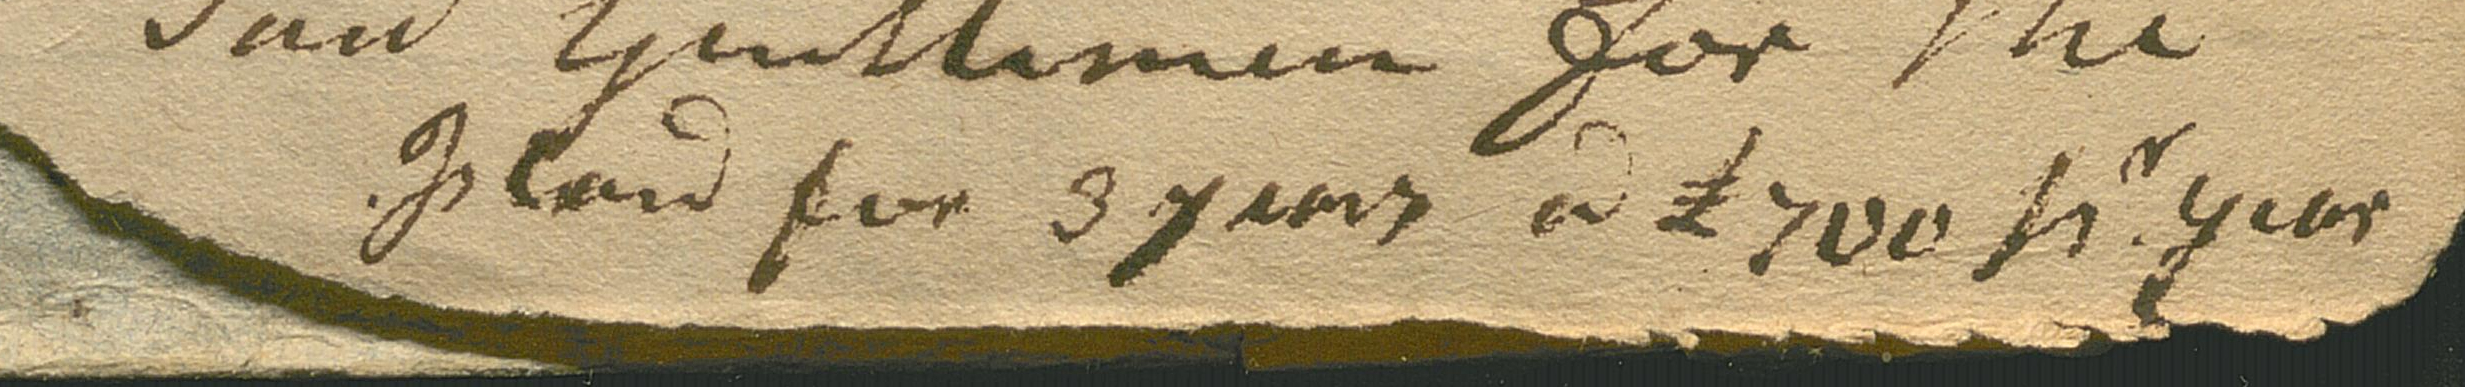Island for 3 years @ £700 p^r. year
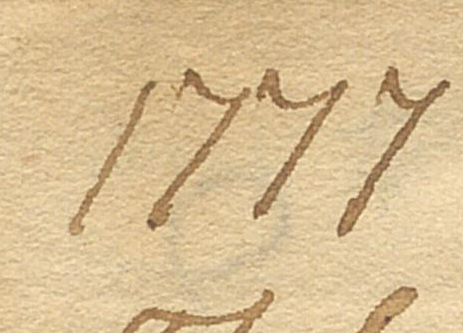1777
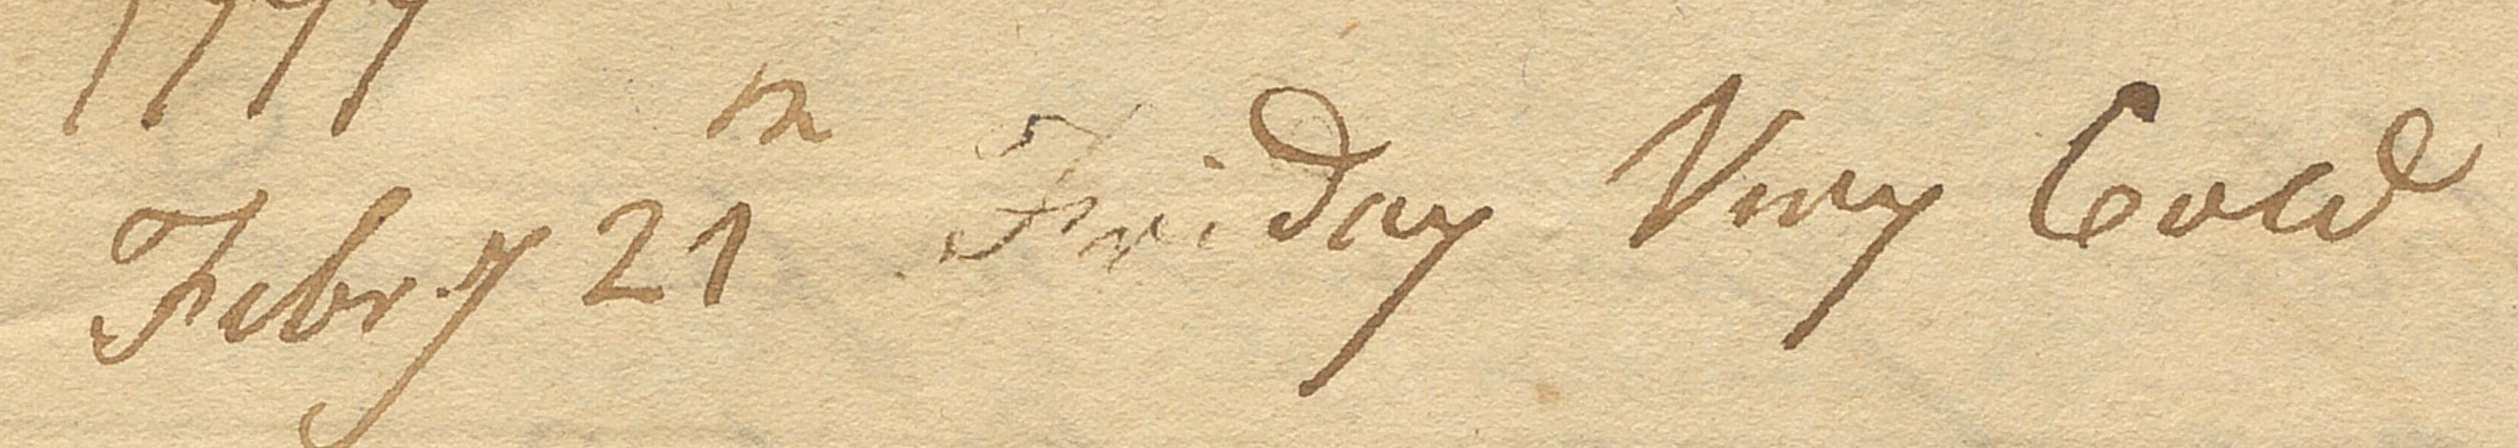Febr^y. 21^th Friday Very Cold
